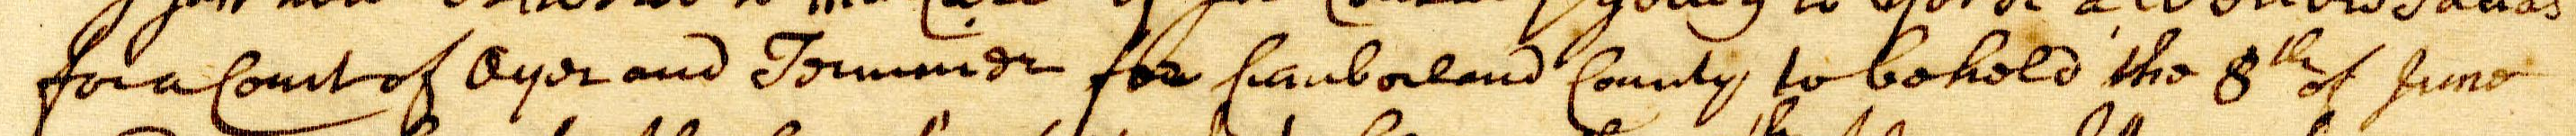for a Court of Oyer and Terminer for Cumberland County to be held the 8^th of June
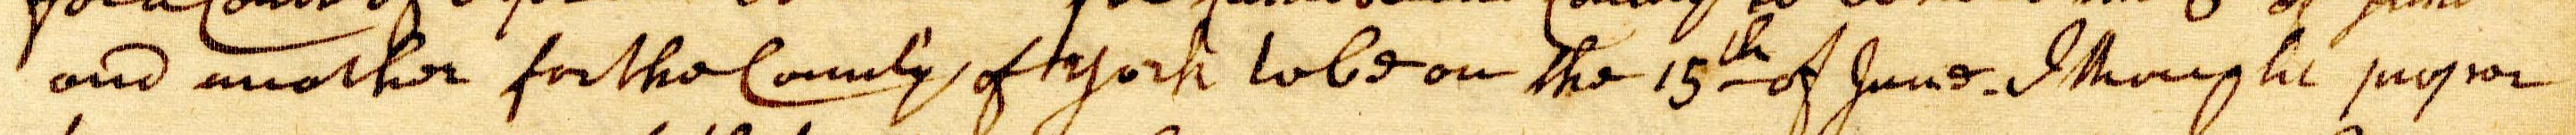and another for the County of York to be on the 15^th of June. I thought proper
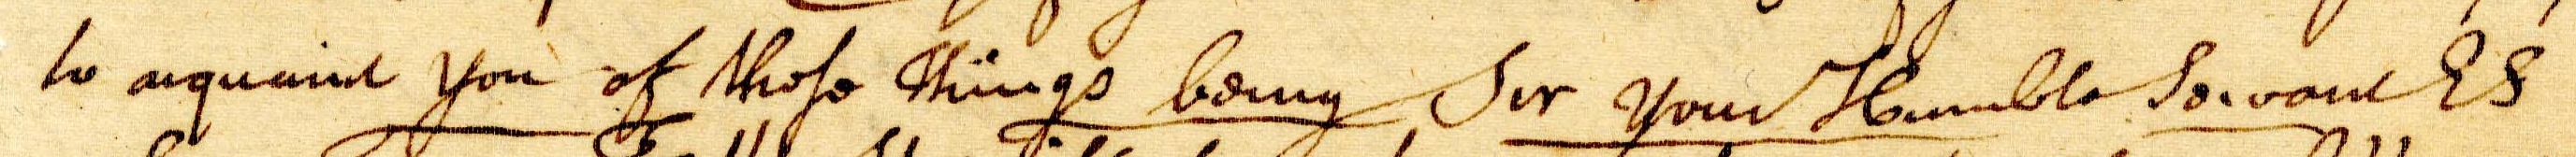to acquaint You of these things being, Sir Your Humble Servant ES
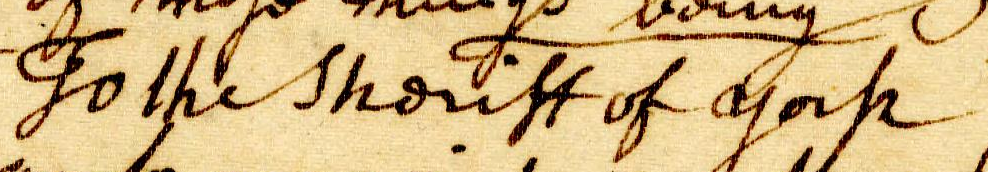To the Sheriff of York
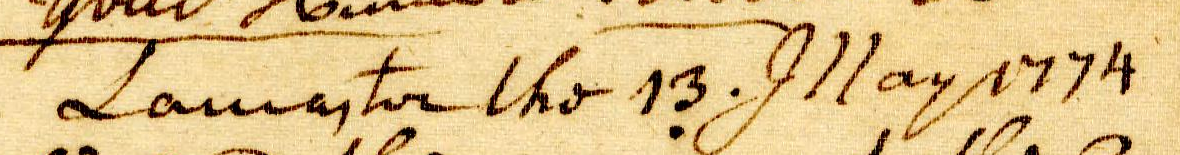Lancaster the 13. May 1774
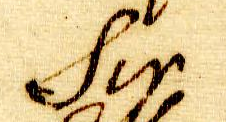Sir
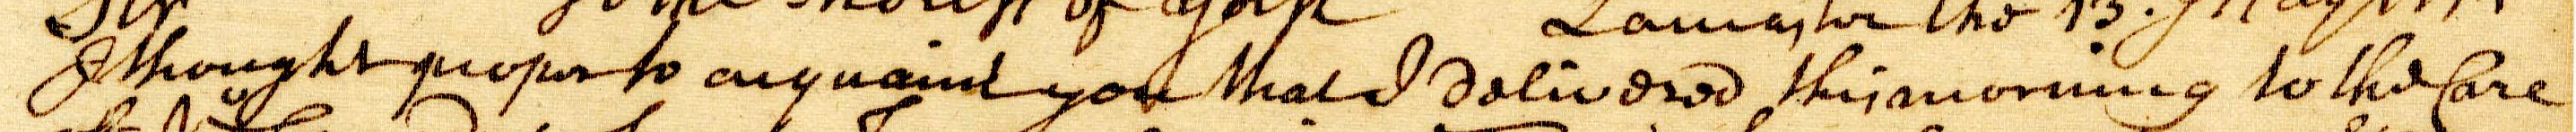I thought proper to acquaint you that I delivered this morning to the Care
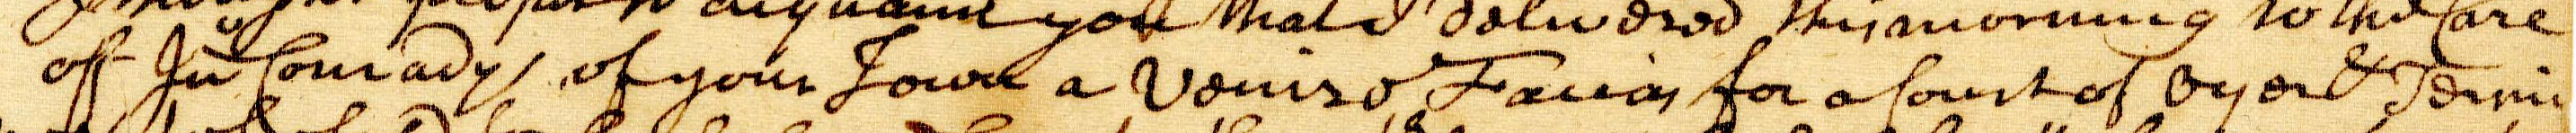of Jn^o Courady of your Town a Venire Facias for a Court of Oyer & Termi
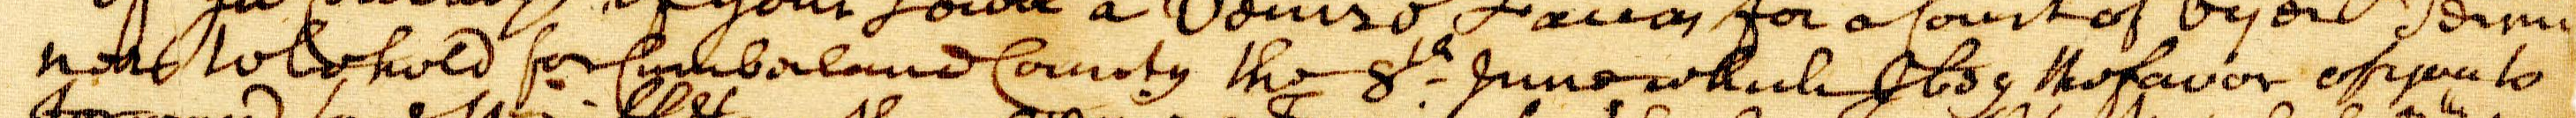ner to be held for Cumberland County the 8^th. June which I beg the favor of you to
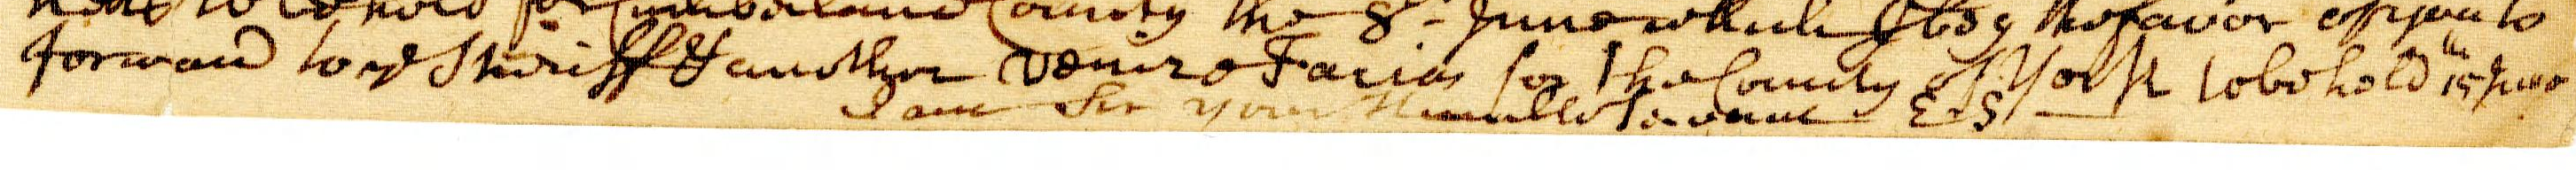forward to y^e Sheriff & another Venire Facias for the County of York to be held 15^th June
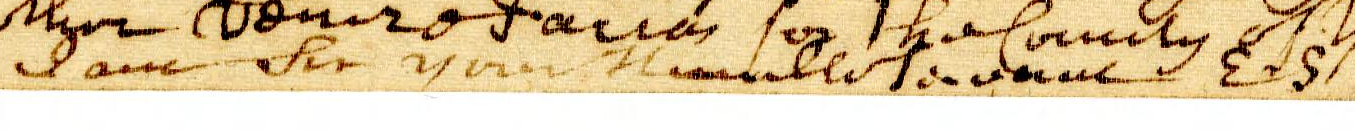I am Sir Your Humble Servant E.S
